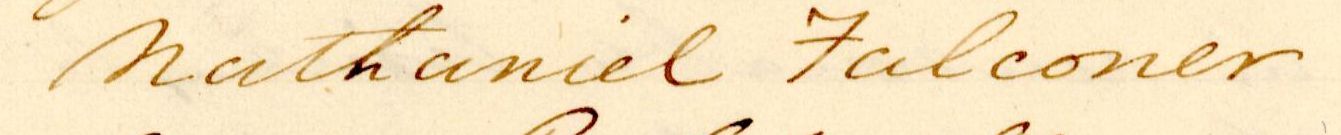Nathaniel Falconer
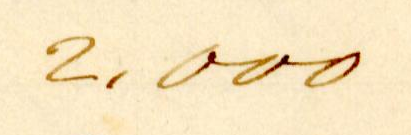2,000
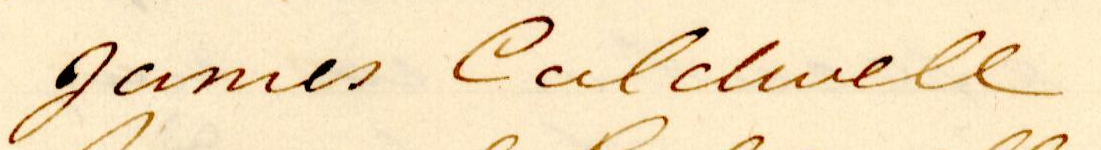James Caldwell
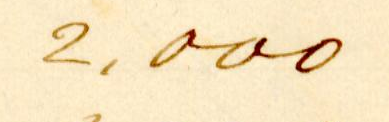2,000
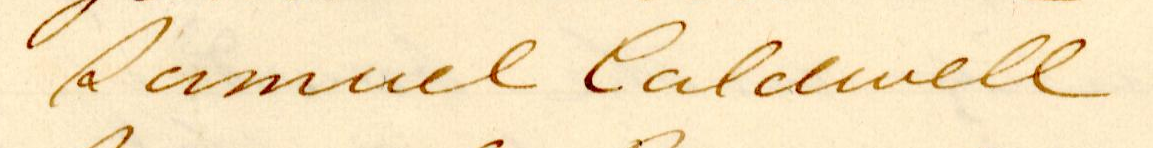Samuel Caldwell
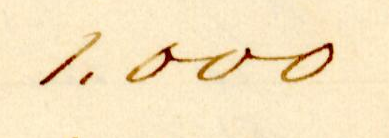1,000
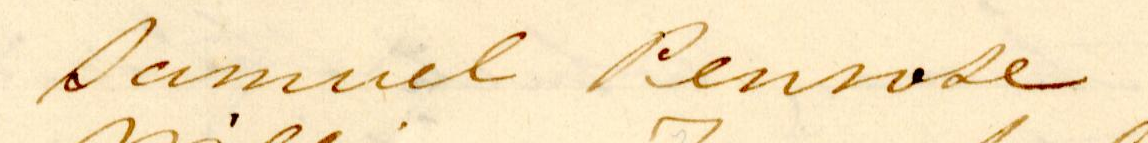Samuel Penrose
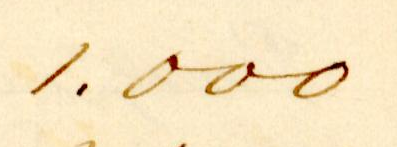1,000
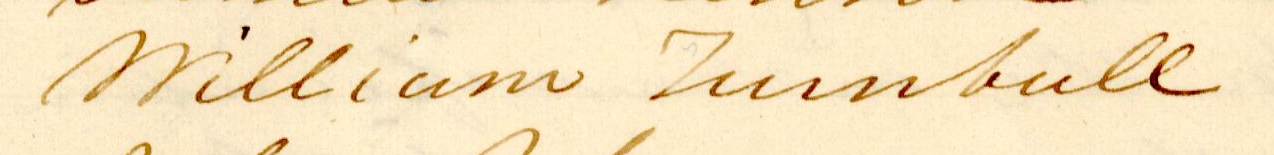William Turnbull
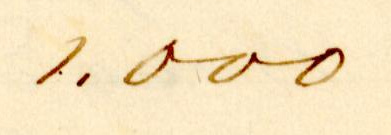2,000
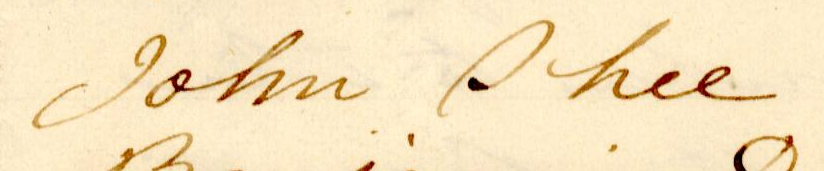John Shee
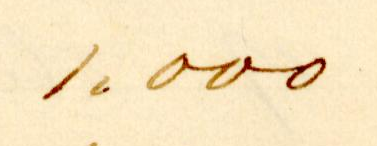1,000
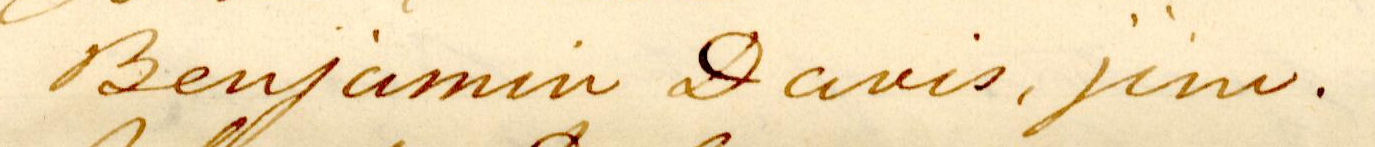Benjamin Davis, jine.
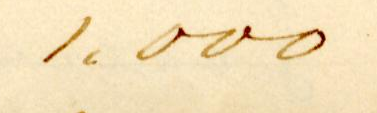1,000
